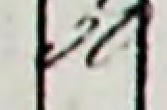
50
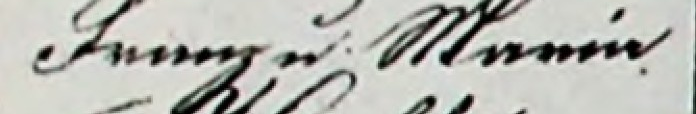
Franz u. Maria
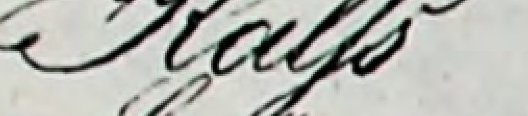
Kalss
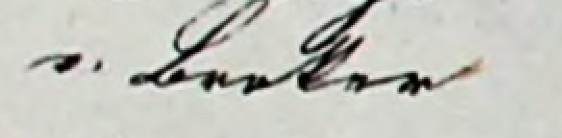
v. Breker
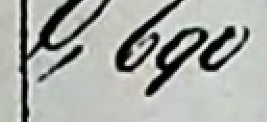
0,690
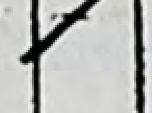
7
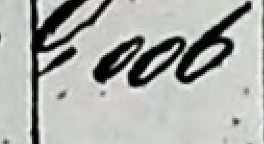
0,006
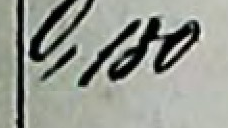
0,180
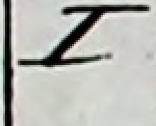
I
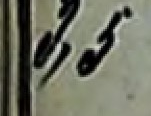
3,5
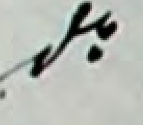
do
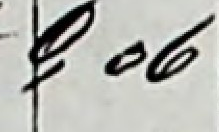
0,06
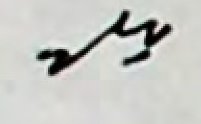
do
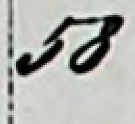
58
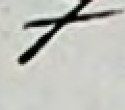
7
